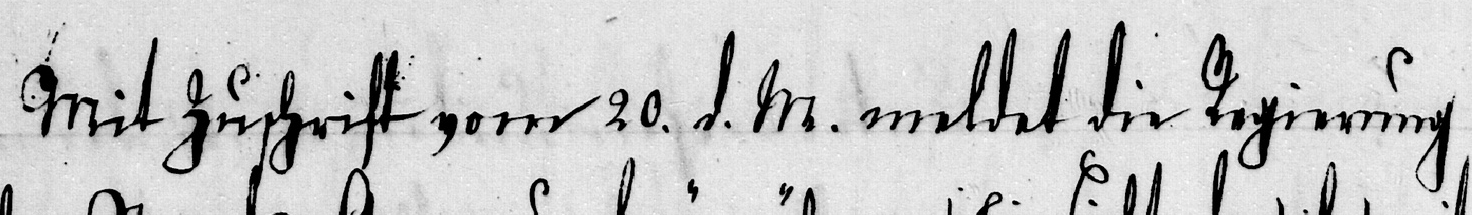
Mit Zuschrift vom 20. d. M. meldet die Regierung
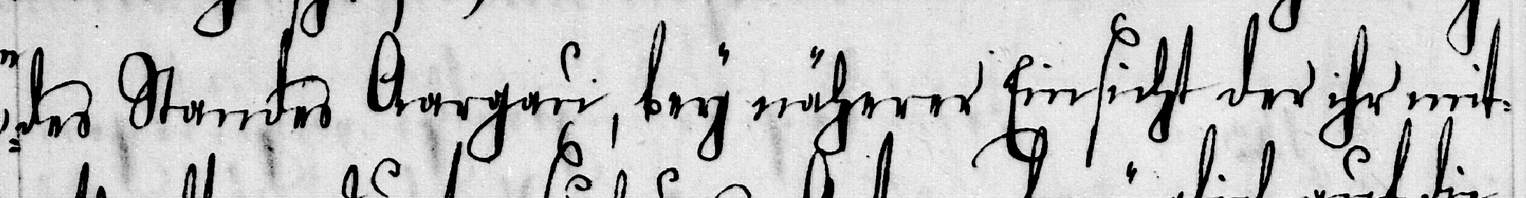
des Standes Aargau, bey näherer Einsicht der ihr mit¬
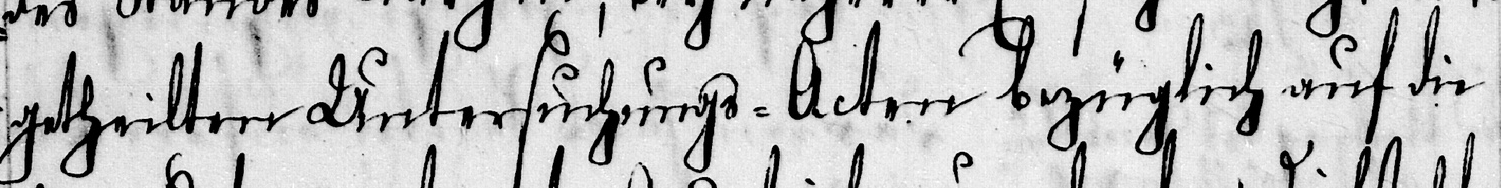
getheilten Untersuchungs-Acten bezüglich auf die
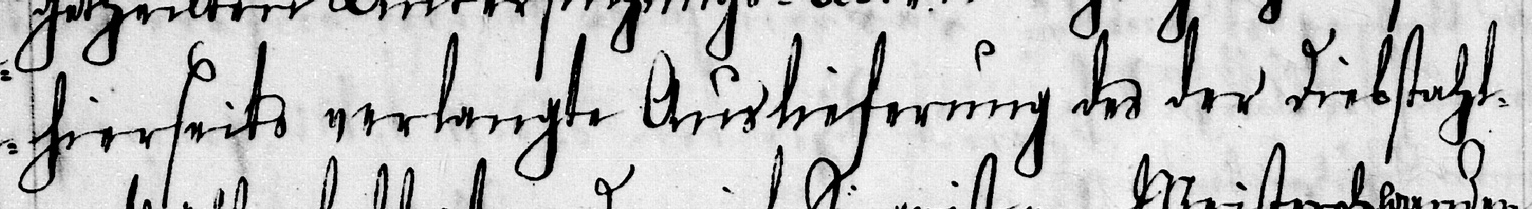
hierseits verlangte Auslieferung des der Diebstahl¬
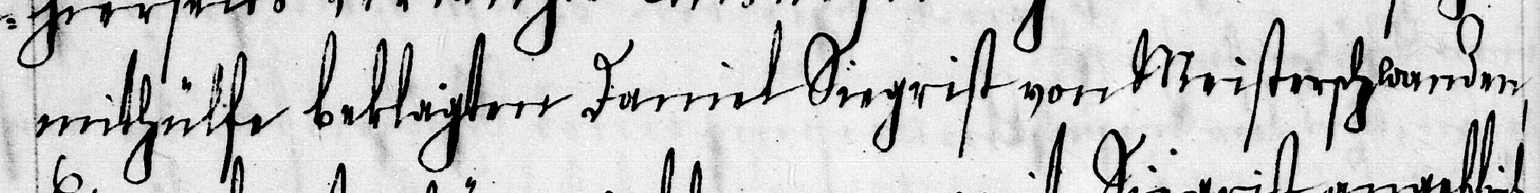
mithülfe beklagten Daniel Siegrist von Meisterschwanden,
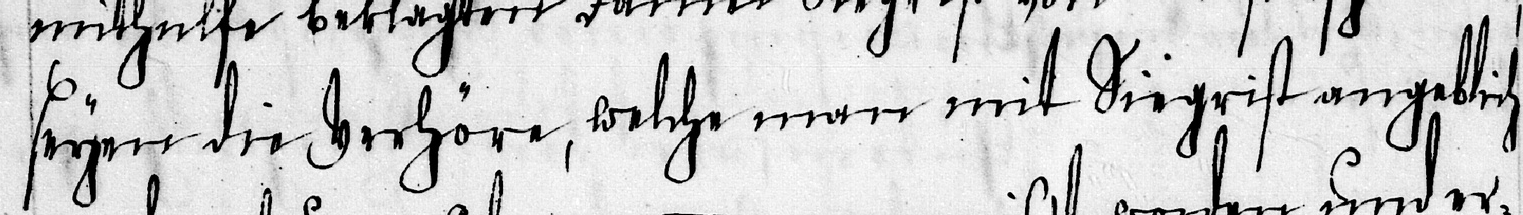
seyen die Verhöre, welche man mit Siegrist angebli¬
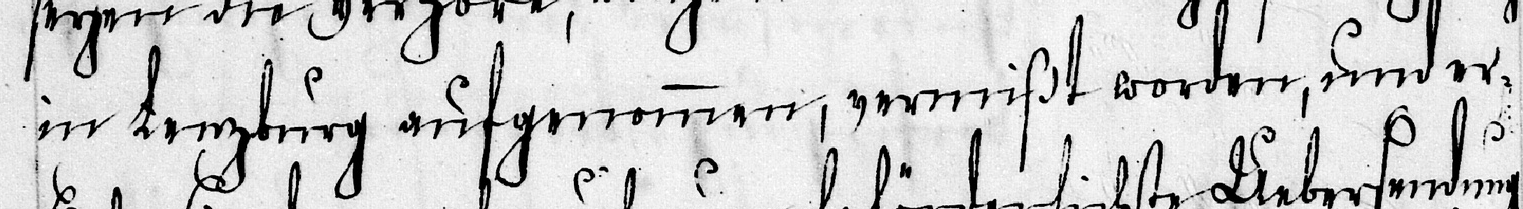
in Lenzburg aufgenommen, vermißt worden, und er¬
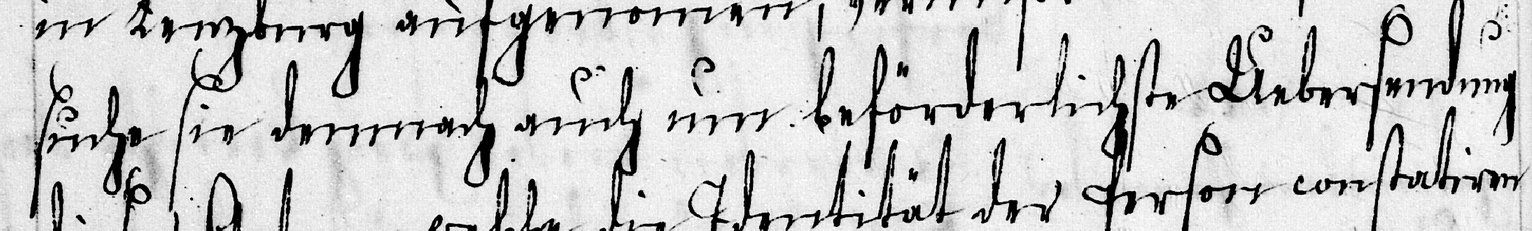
suche sie demnach auch um beförderlichste Uebersendung
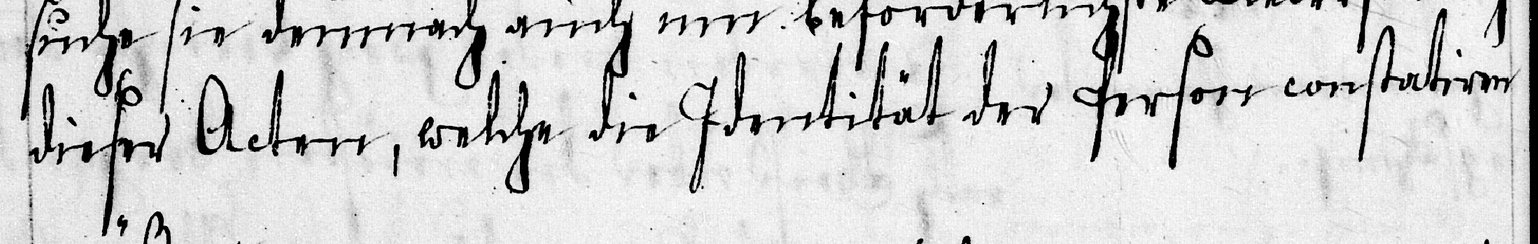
dieser Acten, welche die Identität der Person constatiren
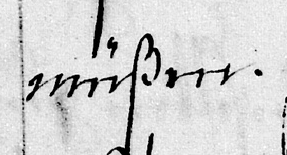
müßen.
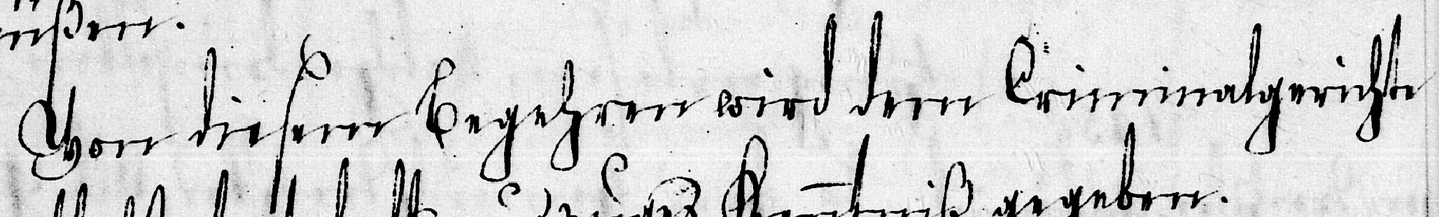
Von diesem Begehren wird dem Criminalgerichte
